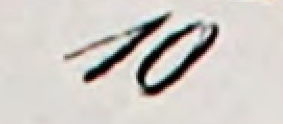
10
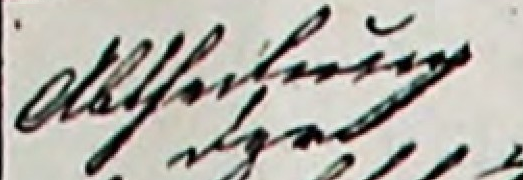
Abtheilung
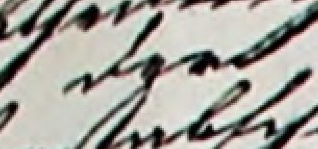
der
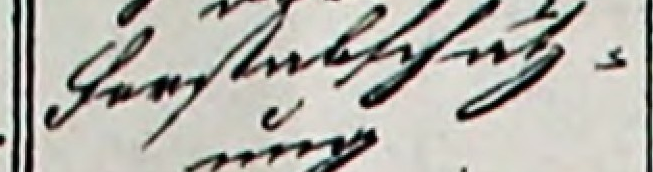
Fanstabschätz„
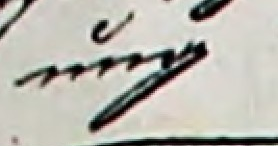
ung
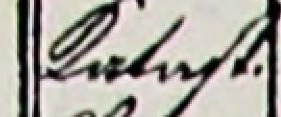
Katast.
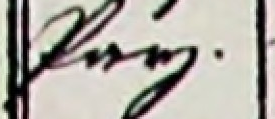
Parz.
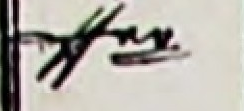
Hnr.
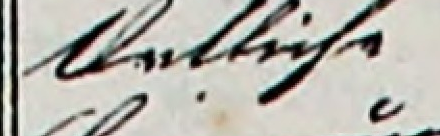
Örtliche
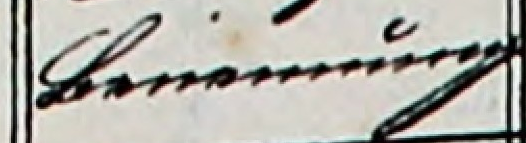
Benennung
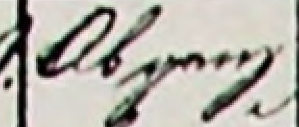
Ob ganz
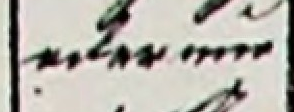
oder nur
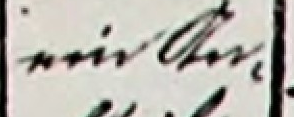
ein An„
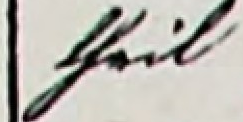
theil
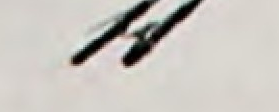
11
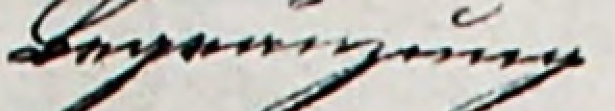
Begränzung
